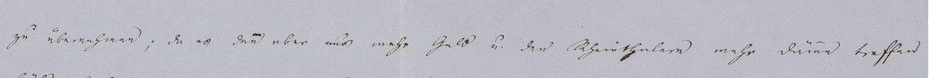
zu übernehmen; da es dann aber uns mehr Geld u. den Rheinthalern mehr Dämme treffen
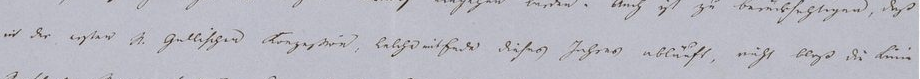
in der ersten St. Gallischen Konzeßion , welche mit Ende dieses Jahres abläuft , nicht bloß die Linie
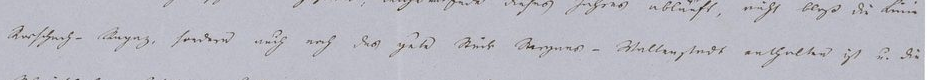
Rorschach–Ragaz, sondern auch noch das gute Stück Sargans–Wallenstadt enthalten ist u. die
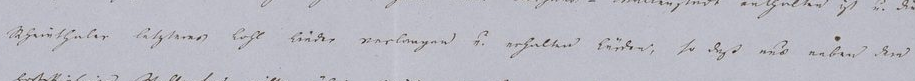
Rheinthaler letzteres wohl wieder verlangen u. erhalten würden, so daß uns neben dem
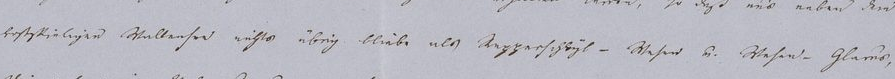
kostspieligen Wallensee nichts übrig bliebe als Rapperschwyl–Wesen u. Wesen–Glarus,
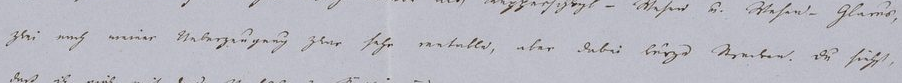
zwei nach meiner Ueberzeugung zwar sehr rentable, aber dabei kurze Strecken. Du siehst,
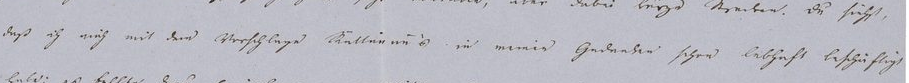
daß ich mich mit dem Vorschlage Rüttimann's in meinen Gedanken schon lebhaft beschäftigt
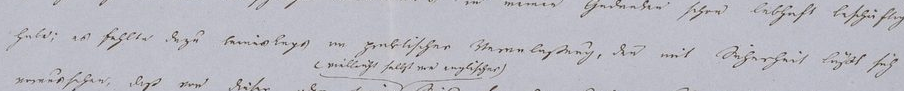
habe; es fehlte dazu keineswegs an praktischer Veranlaßung, denn mit Sicherheit läßt sich
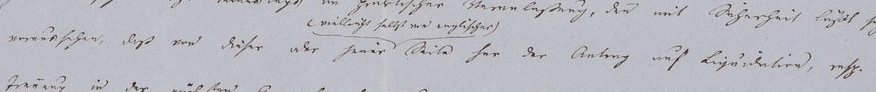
oder jener (vielleicht selbst von englischer) Seite her der Antrag auf Liquidation, resp.
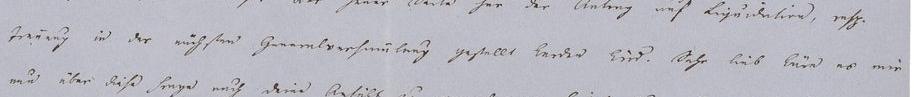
Trennung in der nächsten Generalversammlung gestellt werden wird. Sehr lieb wäre es mir
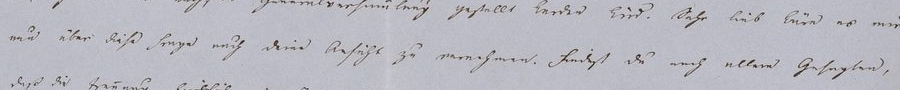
nun über diese Frage auch Deine Ansicht zu vernehmen. Findest Du nach allem Gesagten,
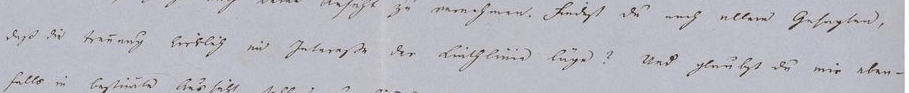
daß die Trennung wirklich im Intereße der Linthlinie läge? Und glaubst Du mir eben-
